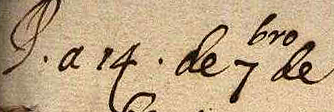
P. a 14. de 7bro de
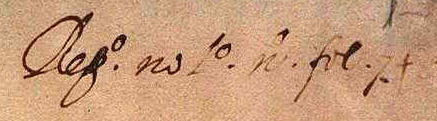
Reg.o no Lo. no. fol 748
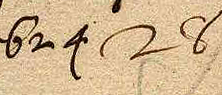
624 28
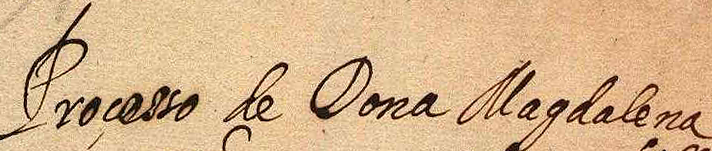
Proçesso de Dona Magdalena
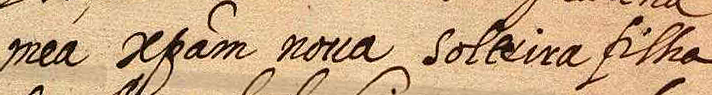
mea xpām noua solteira filha
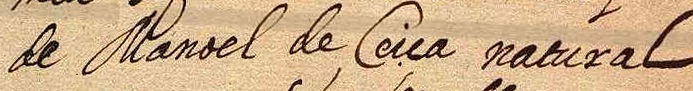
de Manoel de Çeiça naturaL
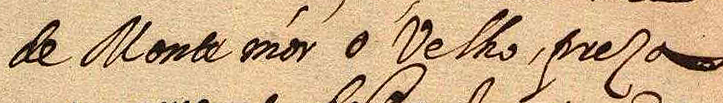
de Montemor o Velho, preza
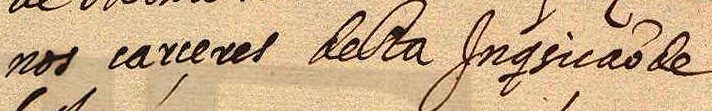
nos carceres desta Jnꝗsiçaõ de
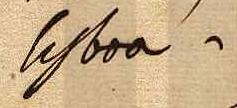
lisboa
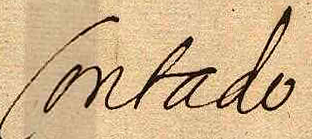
Contado
